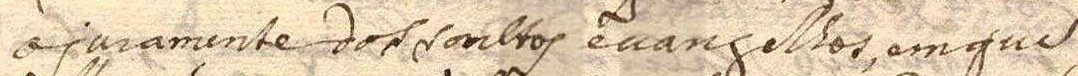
o juramento dos sanCtos euangelhos, em que
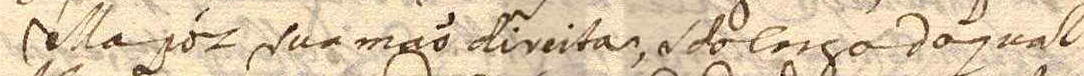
ella poz sua maõ direita, sob cargo do qual
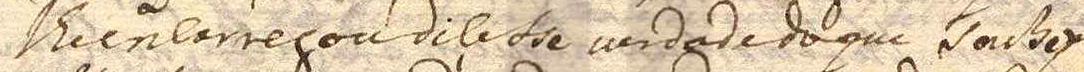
lhe encarregou dicesse uerdade do que souber
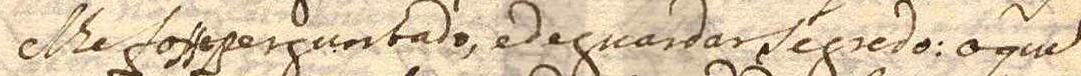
e lhe fosse perguntado, e de guardar segredo: o que
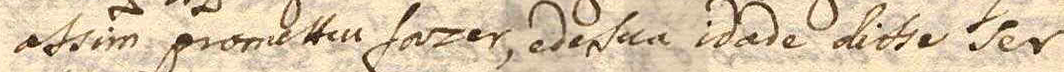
assim prometteu fazer, e de sua idade disse ser
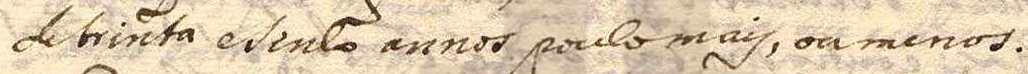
de trinta e sinco annos pouco mais, ou menos.
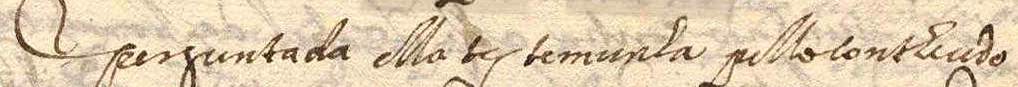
E perguntada ella testemunha pello contheudo
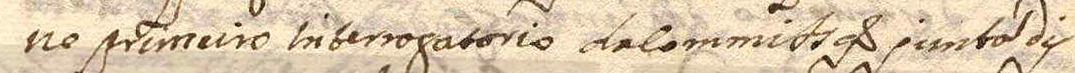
no primeiro interrogatorio da commissaõ junta dis
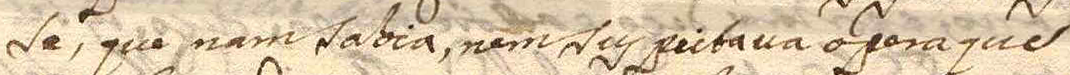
se, que nam sabia, nem suspeitaua o para que
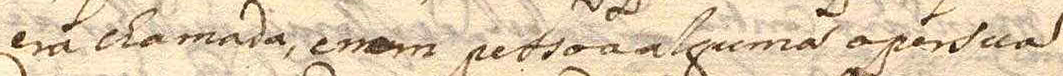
era chamada, e nem pessoa alguma a persua
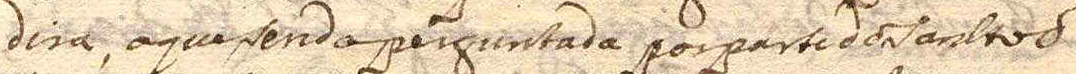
dira, a que sendo perguntada por parte do sancto O
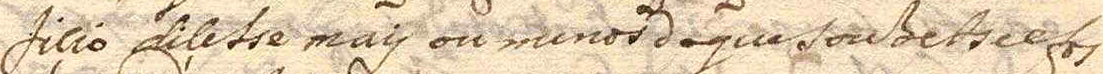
ficio dicesse mais ou menos do que soubesse e fos
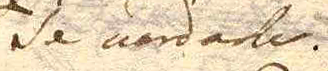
se uerdade.
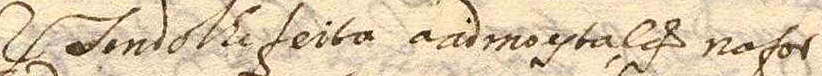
E sendolhe feita a admoestaçaõ na for
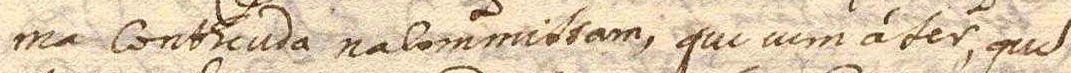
ma Contheuda na commissam, que uem á ser, que
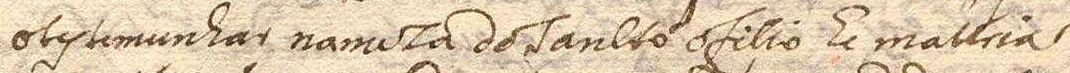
o testemunhar na meza do SanCto officio he materia
